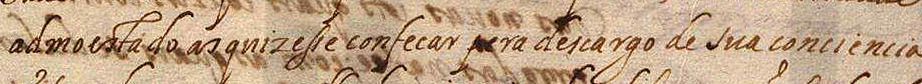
admoestado as quizesse confeçar pera descargo de sua conciencia
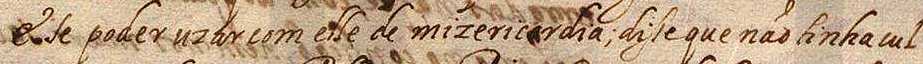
e se poder uzar com elle de mizericordia; dise que naõ tinha cul
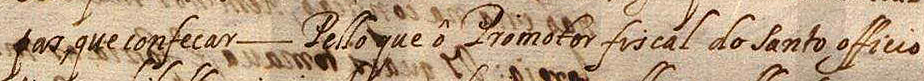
pas, que confeçar - Pello que o Promotor fiscal do Santo officio
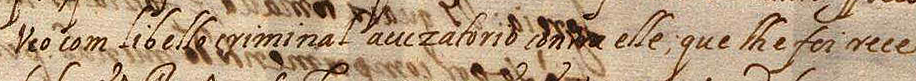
Veo com libello criminal acuzatorio contra elle, que lhe foi rece
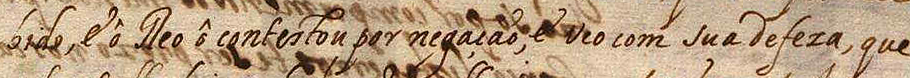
bido, e o Reo ô contestou por negaçaõ, e veo com sua defeza, que
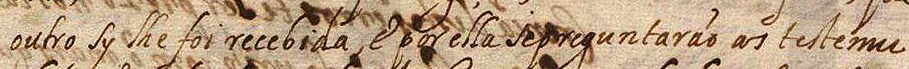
outro sy lhe foi recebida, e por ella se preguntarão as testemu
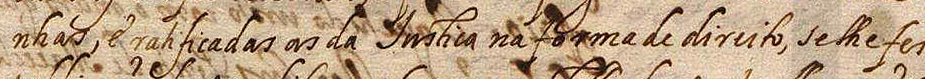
nhas, e ratificadas as da Iustiça na forma de direito, se lhe fes
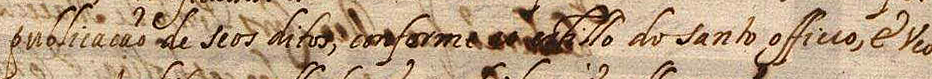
publicação de seos ditos, conforme ao estillo do santo officio, e veo
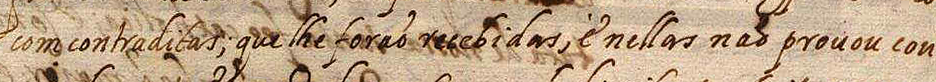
com contraditas; que lhe foraõ recebidas, e nellas naõ prouou cou
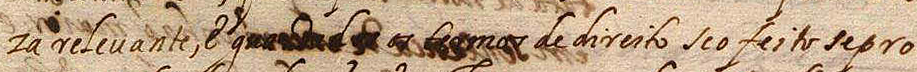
za releuante, e guardado os termos de direito seo feito se pro
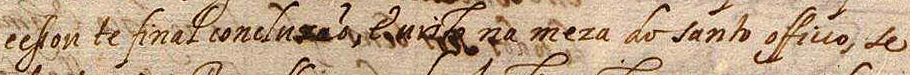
cessou te final concluzaõ, e uisto na meza do santo officio, se
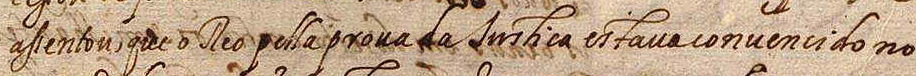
assentou, que o Reo pella proua da Iustiça estaua conuencido no
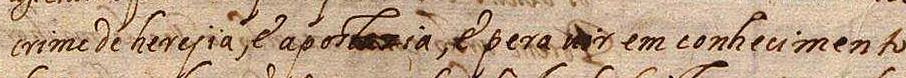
crime de herejia, e apostazia, e pera uir em conhecimento
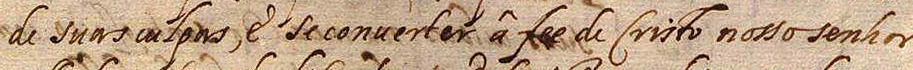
de suas culpas, e se conuerter â fee de Cristo nosso senhor
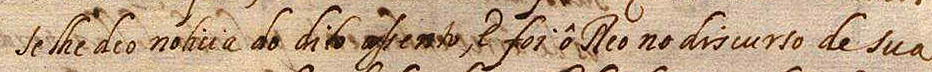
se lhe deo noticia do dito assento, e foi o Reo no discurso de sua
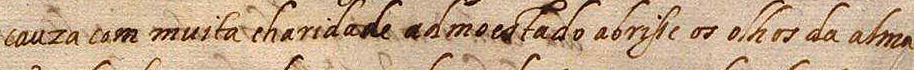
cauza com muita charidade admoestado abrisse os olhos da alma
